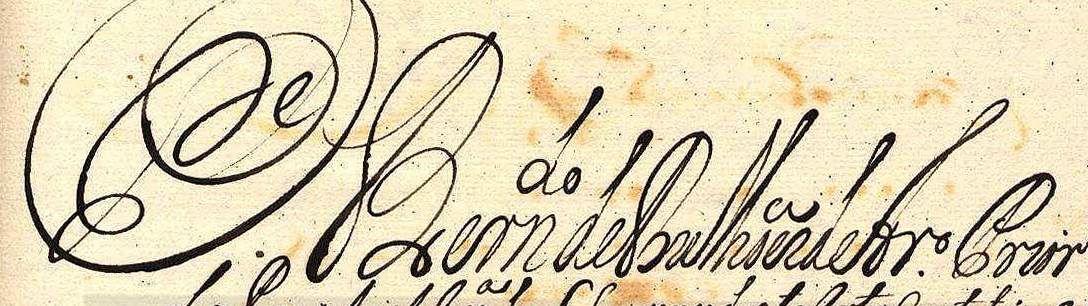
O Pe. Bern.do de Bulhões Ar.o Prior
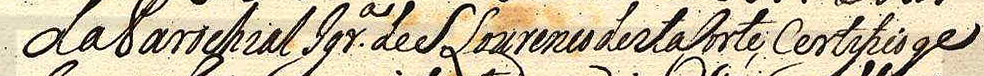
da Parochial Igr.a de S Lourenço desta Corte, Certifico qe
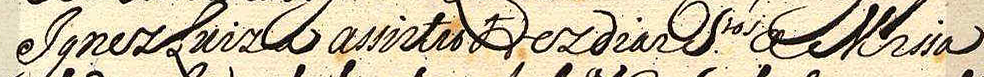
Ignez Luiza assistio trez dias S.tos a Missa
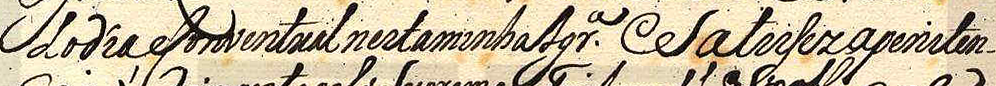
do dia, e Conventual nesta minha Igr.a e Satisfez a peniten
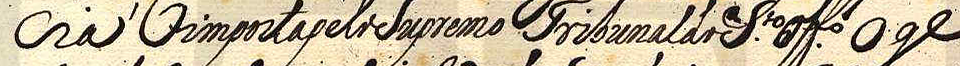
Cia imposta pelo Supremo Tribunal do S.to off.o O qe
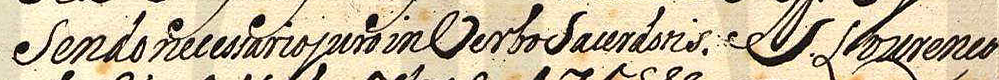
Sendo necessario juro in Verbo Sacerdotis: S. Lourenço
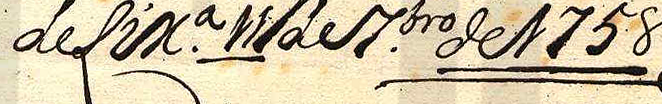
de Lix.a 11 de 7.bro de 1758
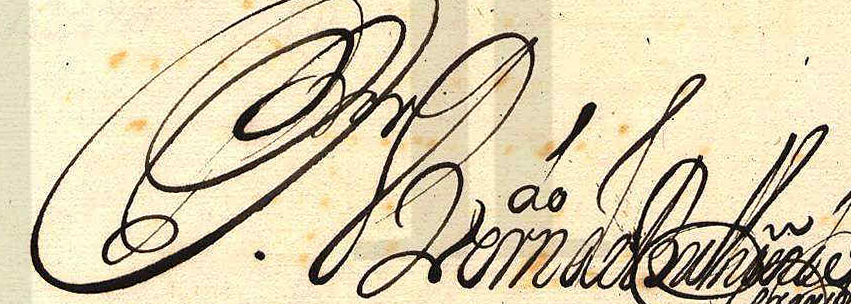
O P.ror Berndo de Bulhões
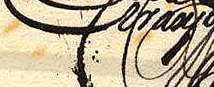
Araujo
